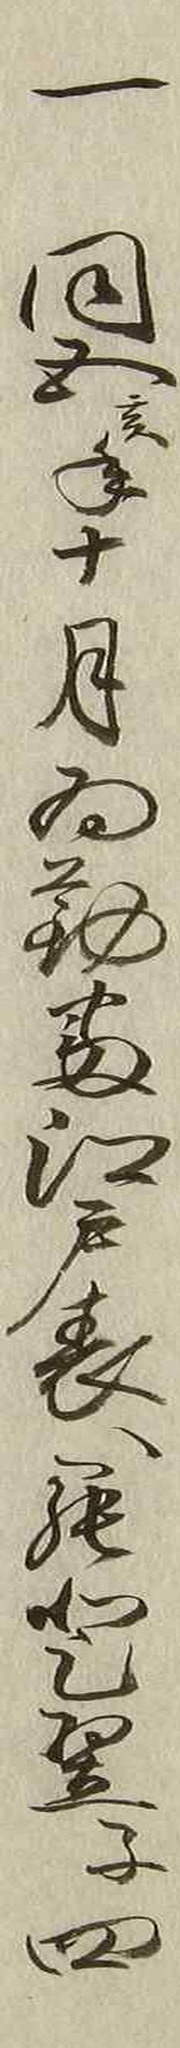一同五亥年十月為勤番江戸表へ罷登翌子四
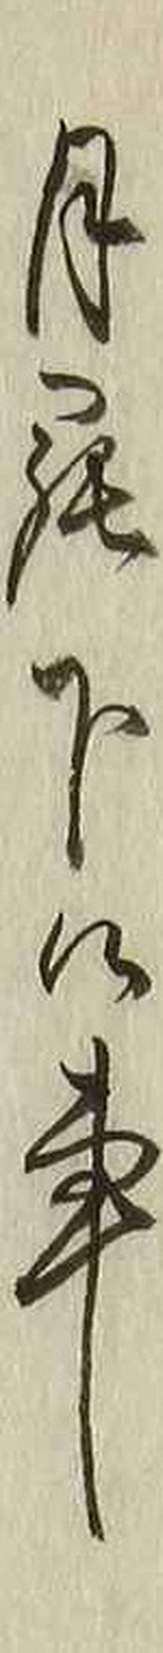月罷下候事
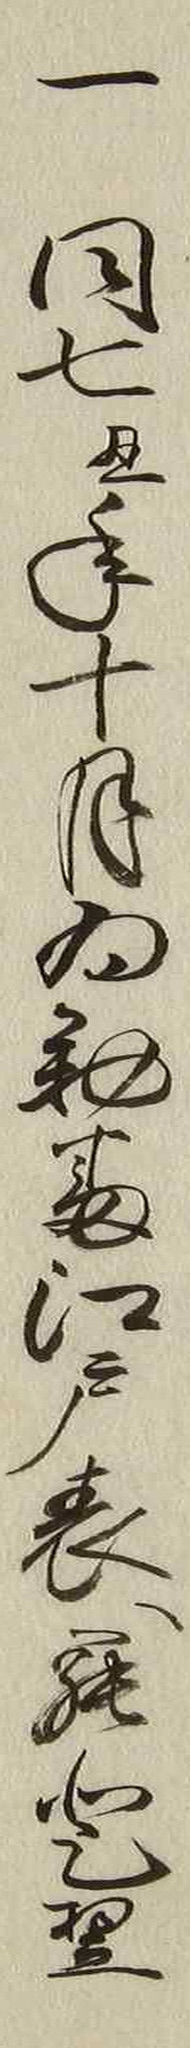一同七丑年十月為勤番江戸表へ罷登翌
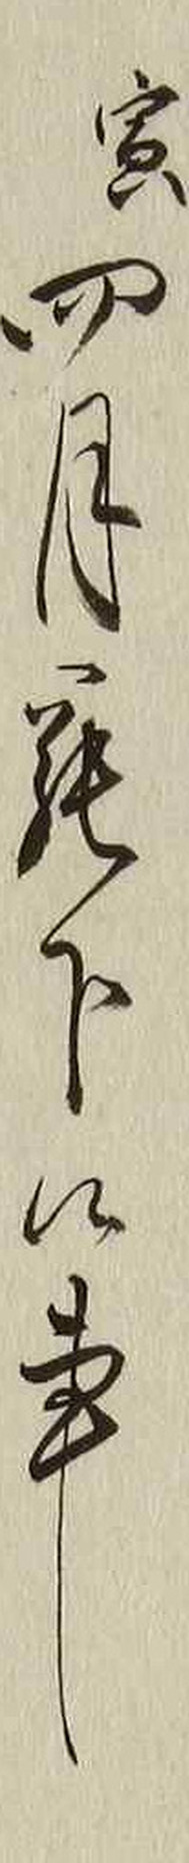寅四月罷下候事
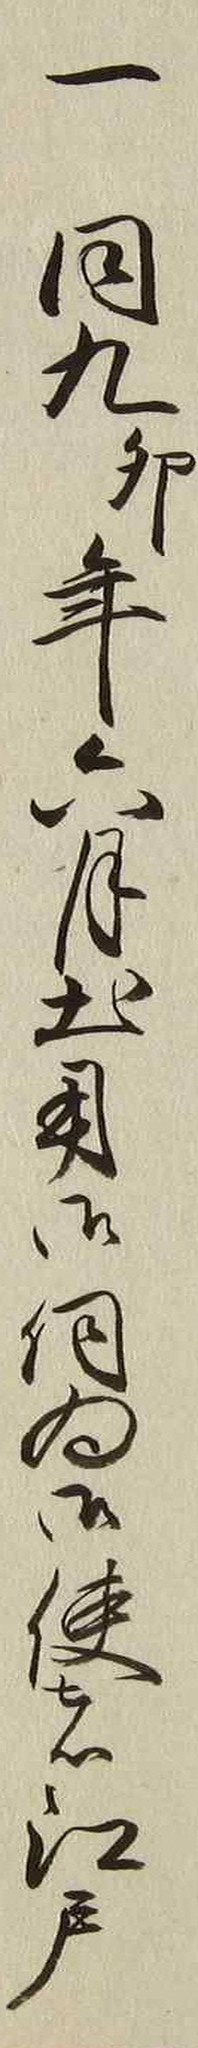一同九卯年六月土用御伺為御使者江戸
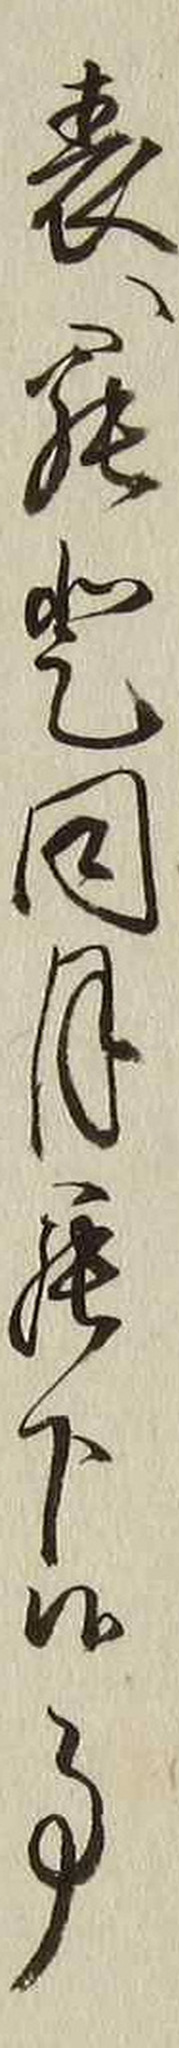表へ罷登同月罷下候事
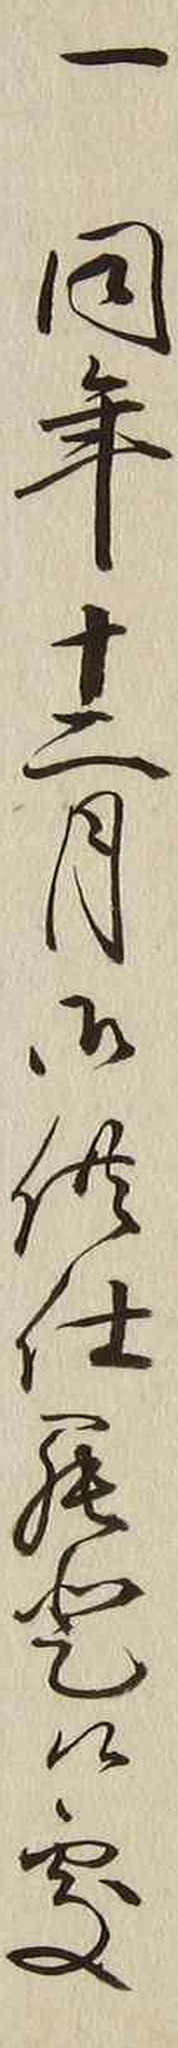一同年十二月御供仕罷登候処
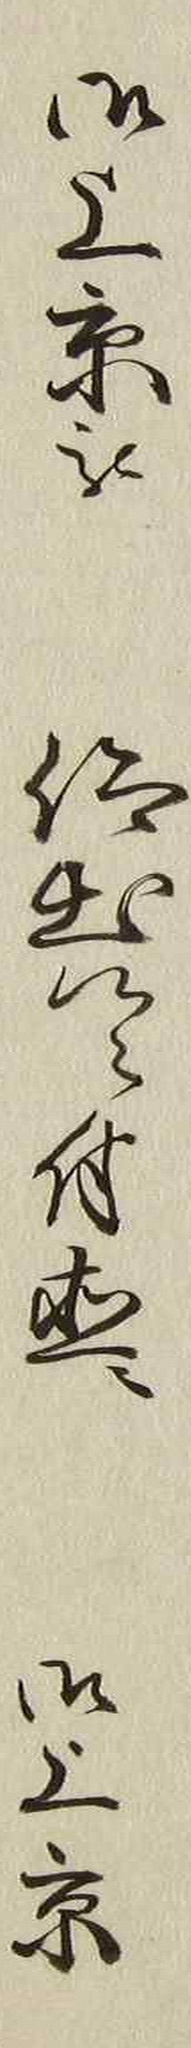御上京被仰出候ニ付直ニ御上京
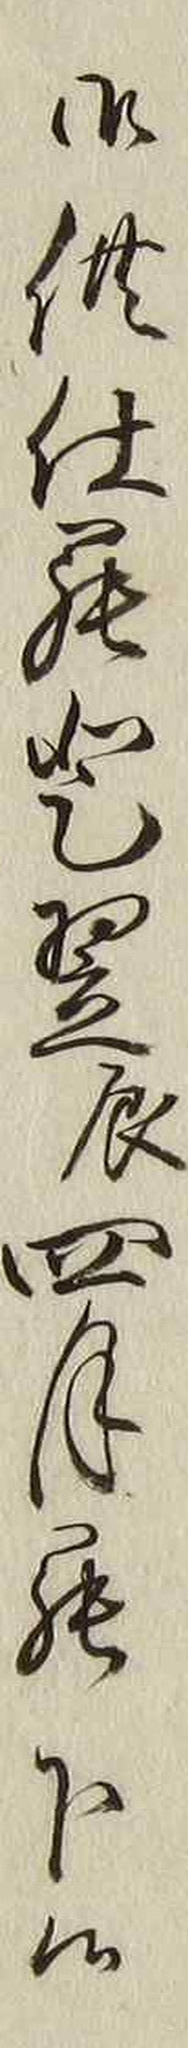御供仕罷登翌辰四月罷下候
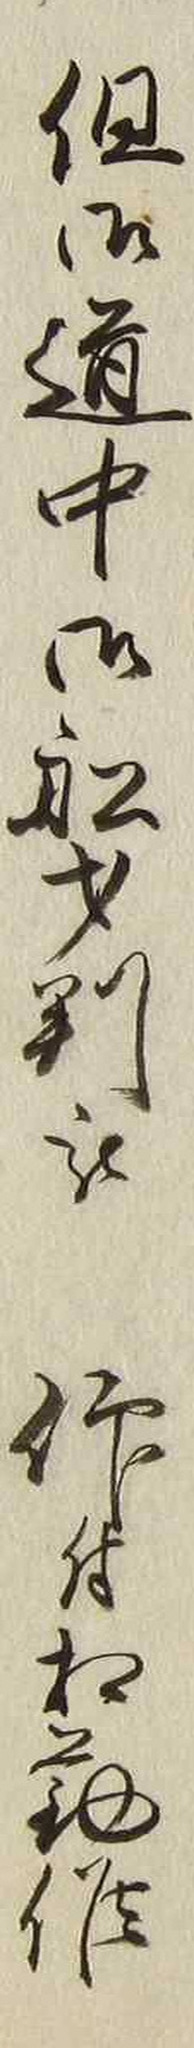但御道中御船才判被仰付相勤候
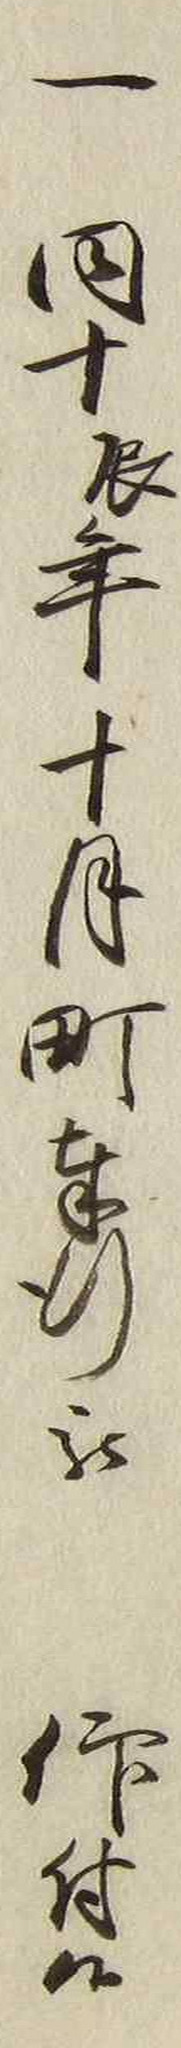一同十辰年十月町奉行被仰付候
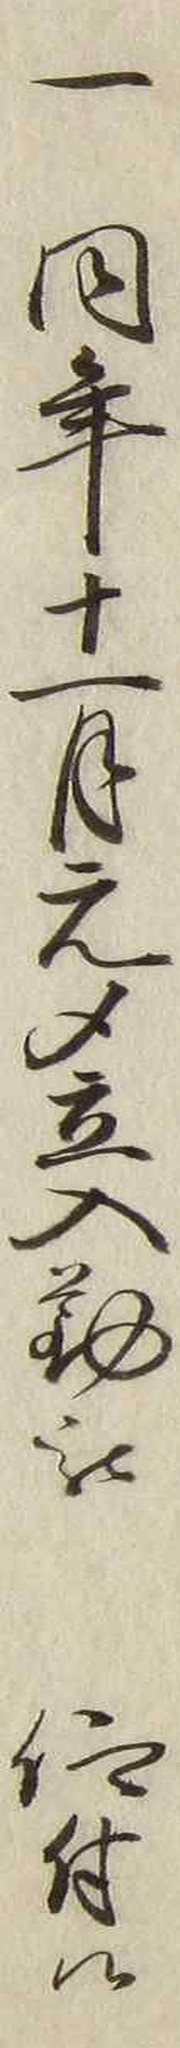一同年十一月元〆立入勤被仰付候

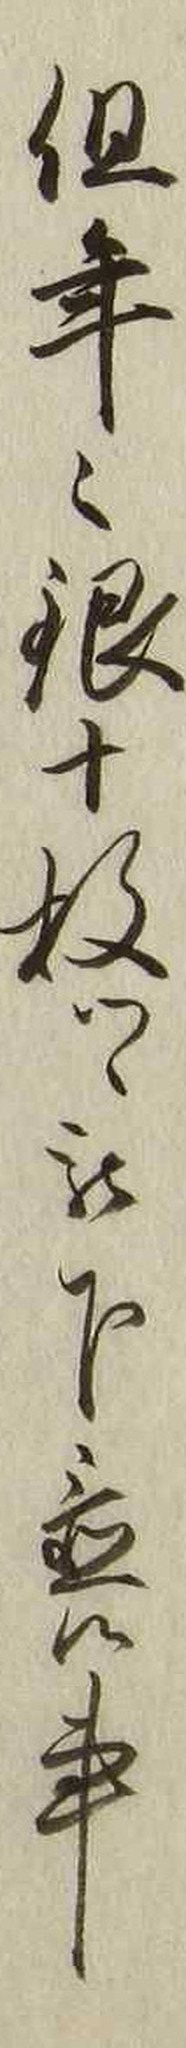但年々銀十枚ツヽ被下置候事
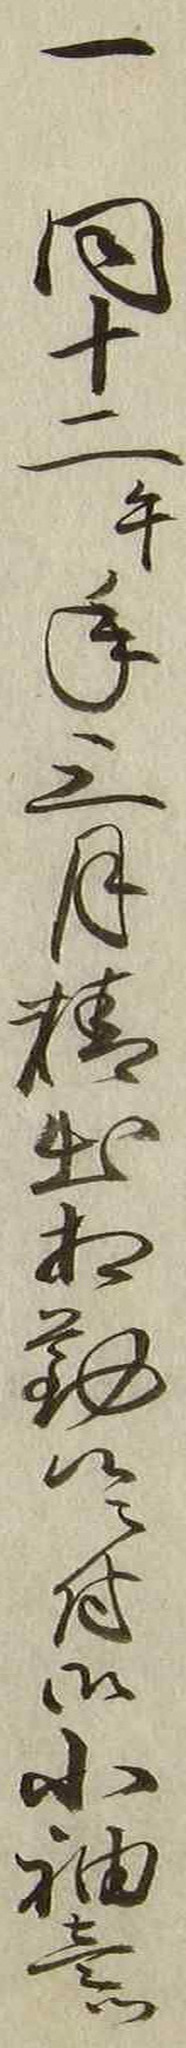一同十二午年三月精出相勤候ニ付御小袖壱ツ
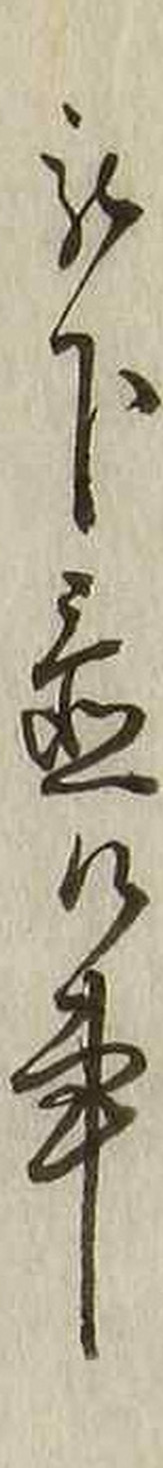被下置候事
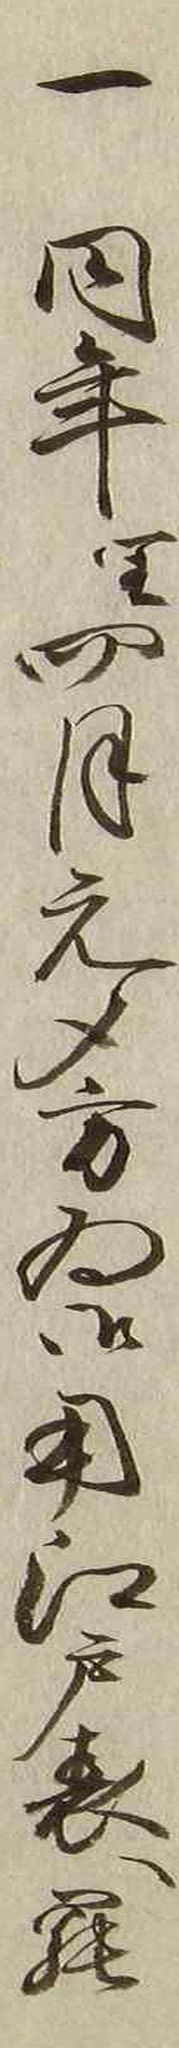一同年閏四月元〆方為御用江戸表へ罷
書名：諸士系譜　巻之21　い之部21
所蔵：会津若松市立会津図書館
